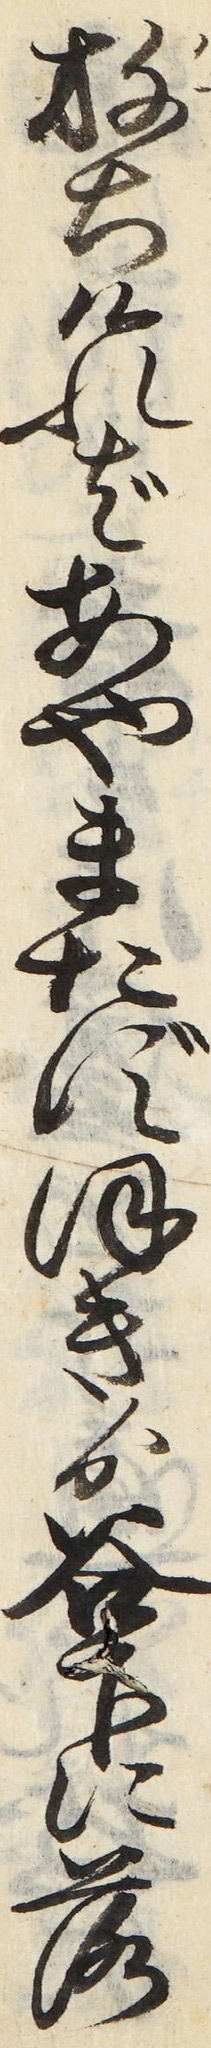放ちければあやまたずほきゟ谷下に落
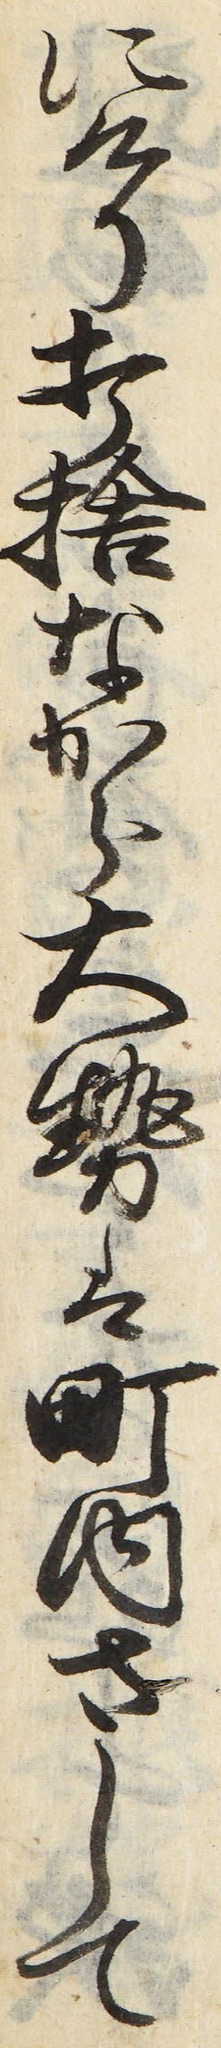にけり打捨なから大勢は町内さして

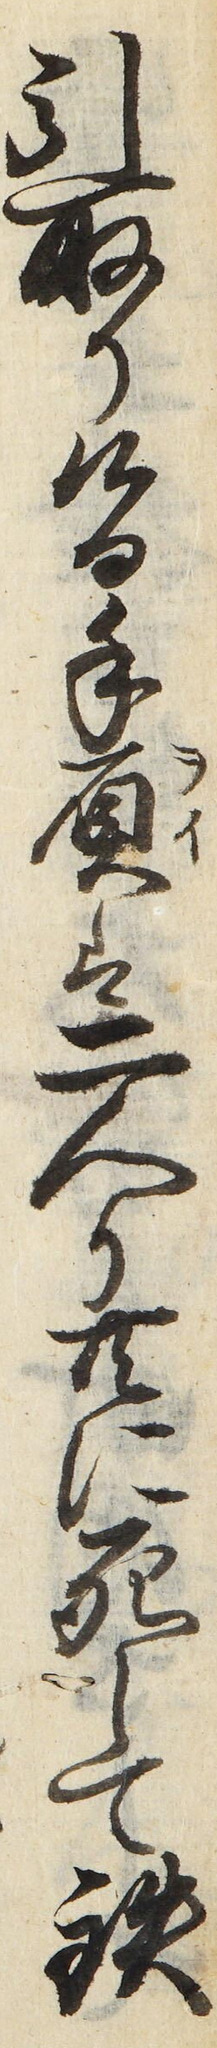引取りける手負は二人り共に死して鉄
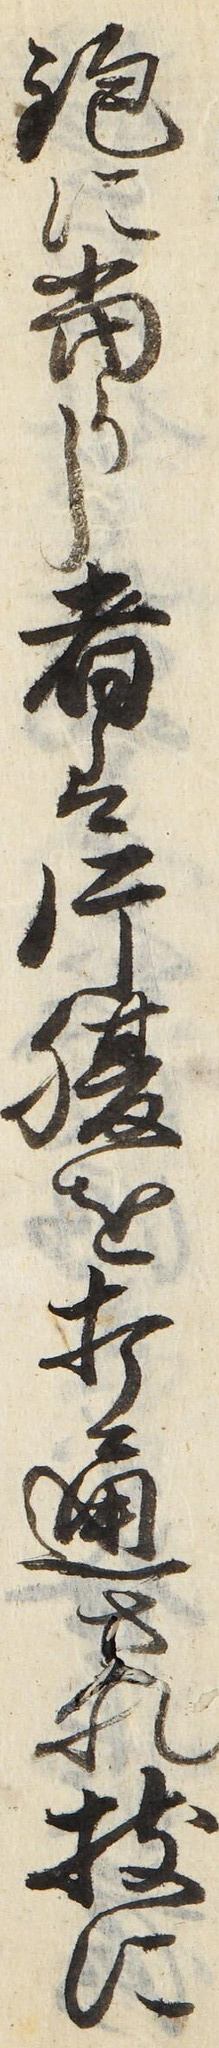砲に当りし者は片腹を打通され枝に
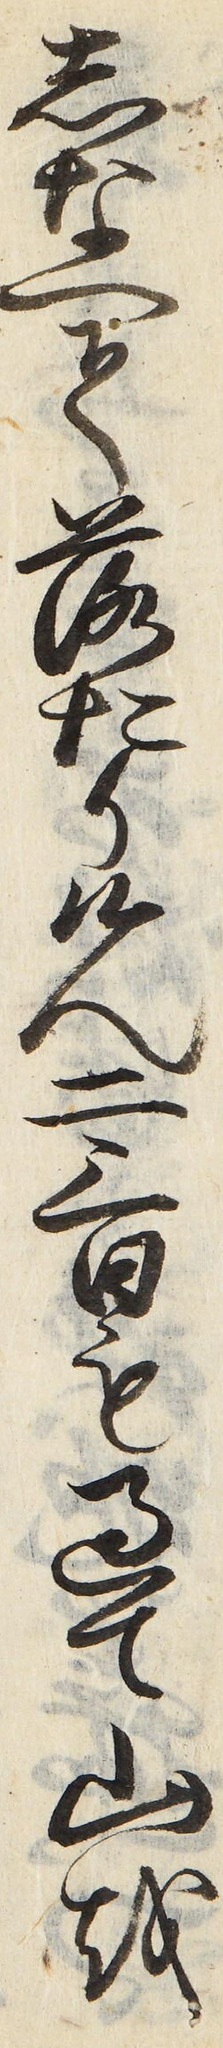しなへて落たりけん二三日も過て山を
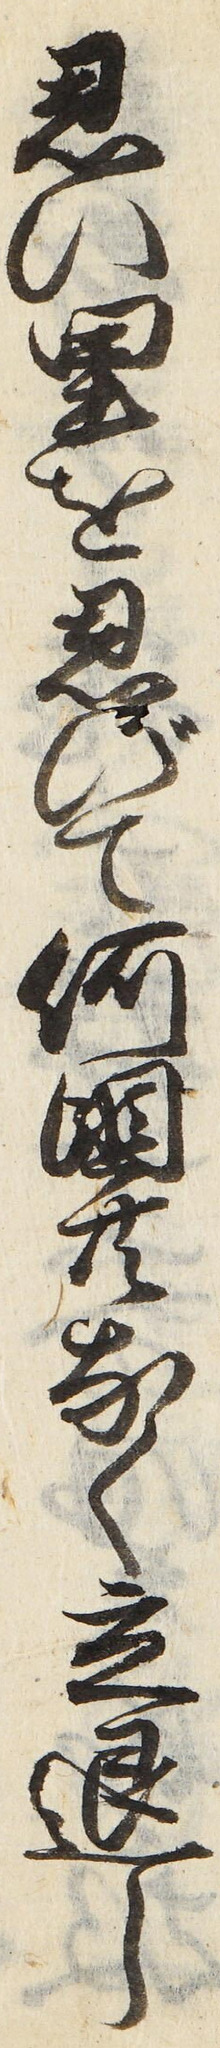忍ひ里を忍びて何国共なく立退し
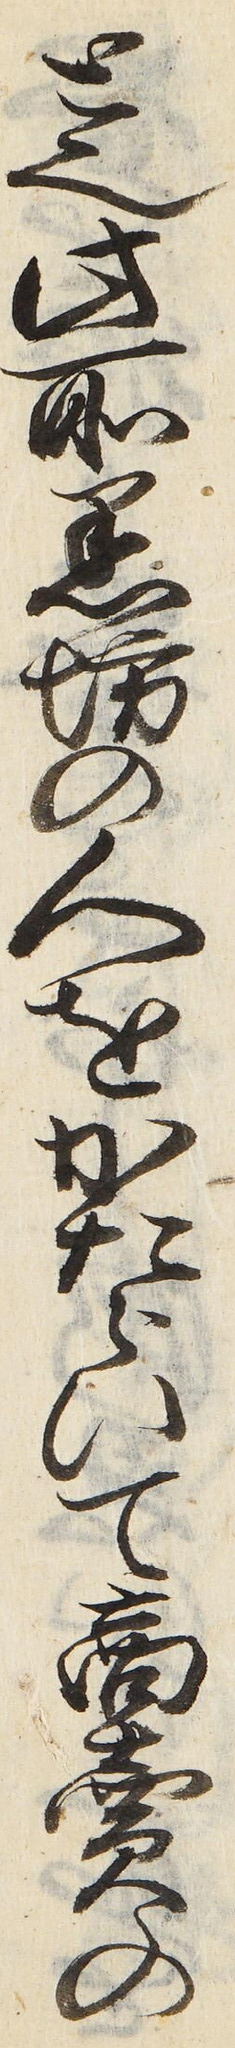と也此所黒坊の人をかたらひて商売の
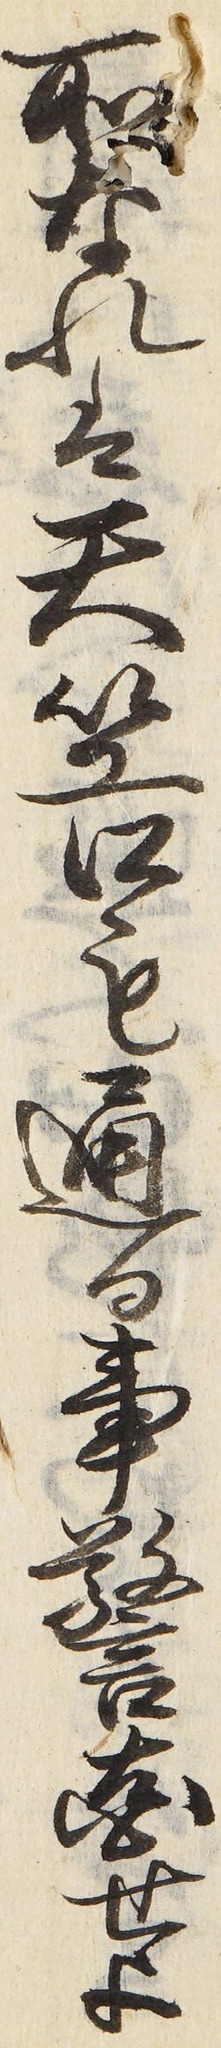所なれは天竺口も通る事警固せよ
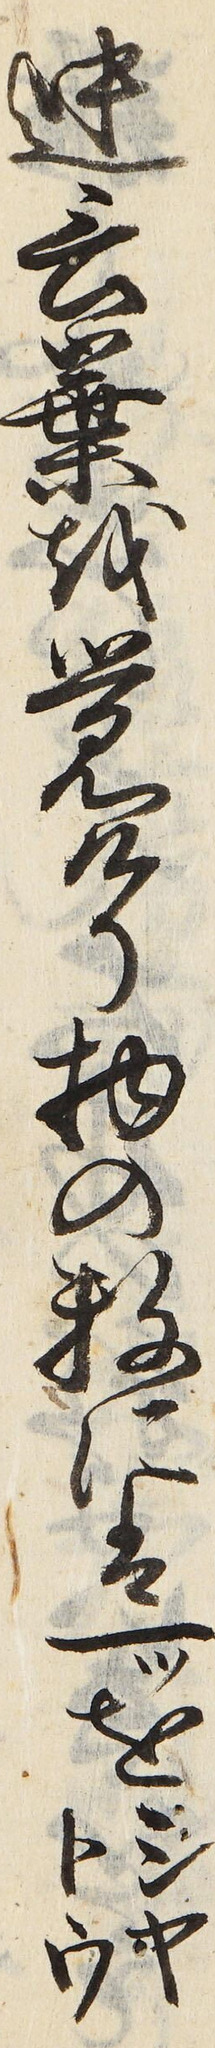迚言葉を覚けり物の数には一ツをしシヤトウ
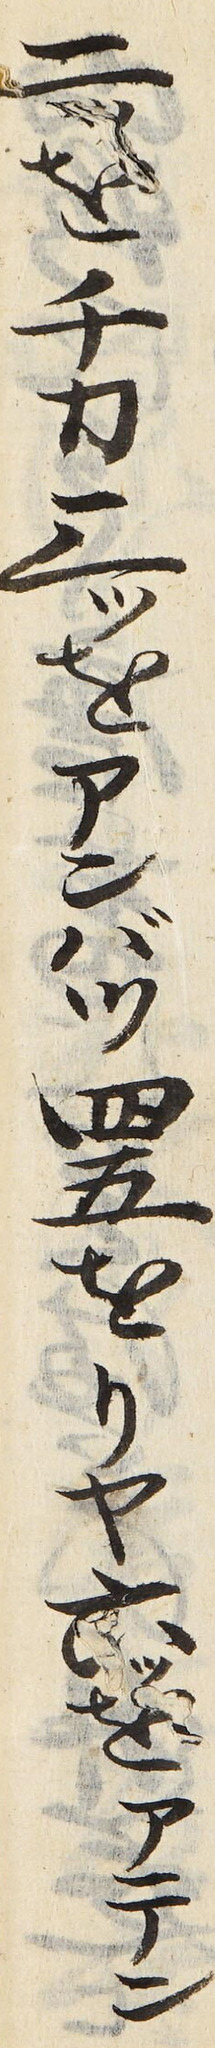二ツをチカ三ツをアンバツ四五をリヤ六ツをアテン
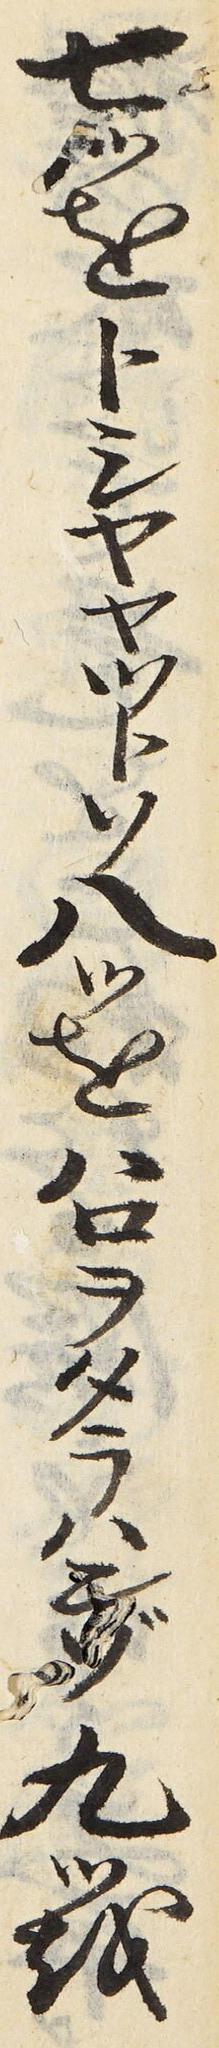七ツをトシヤヤツトソ八ツをハロヲタラハンダ九ツを
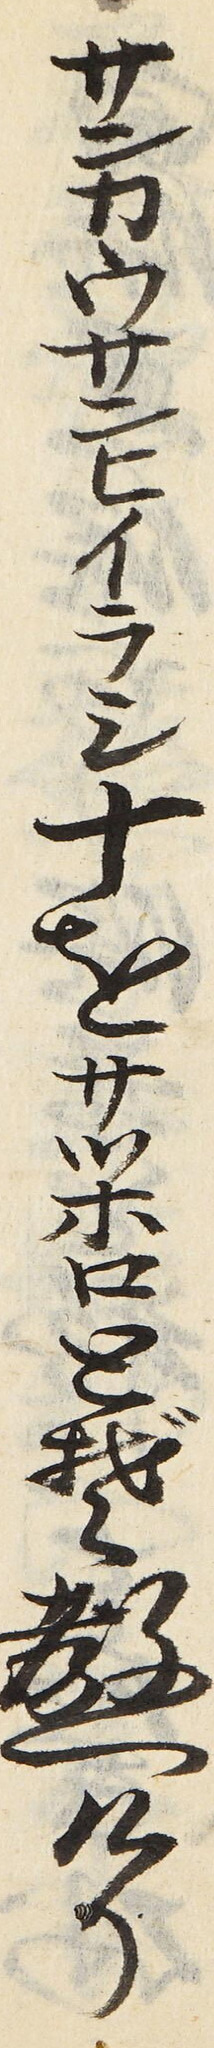サンカウサンヒイラシ十をサツホロとぞ教へけり
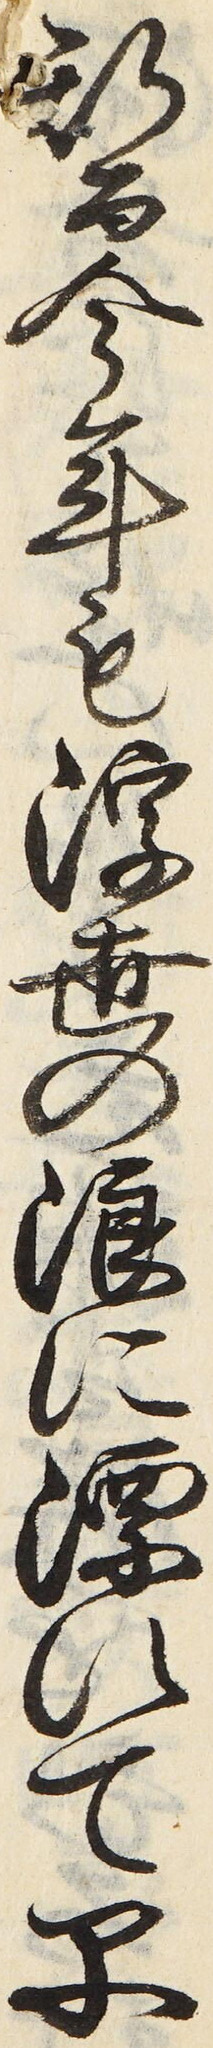斯而今年も浮世の浪に漂ひて早
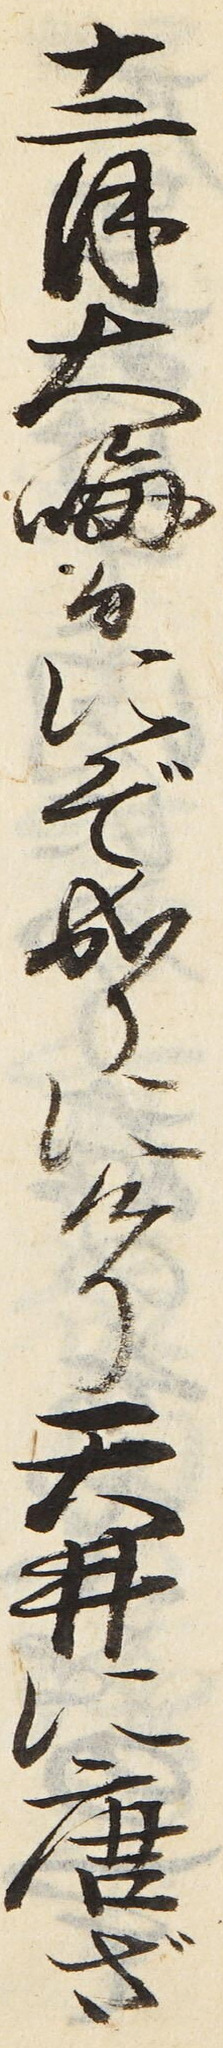十二月大晦日にぞ成りにけり天井に唐ざ
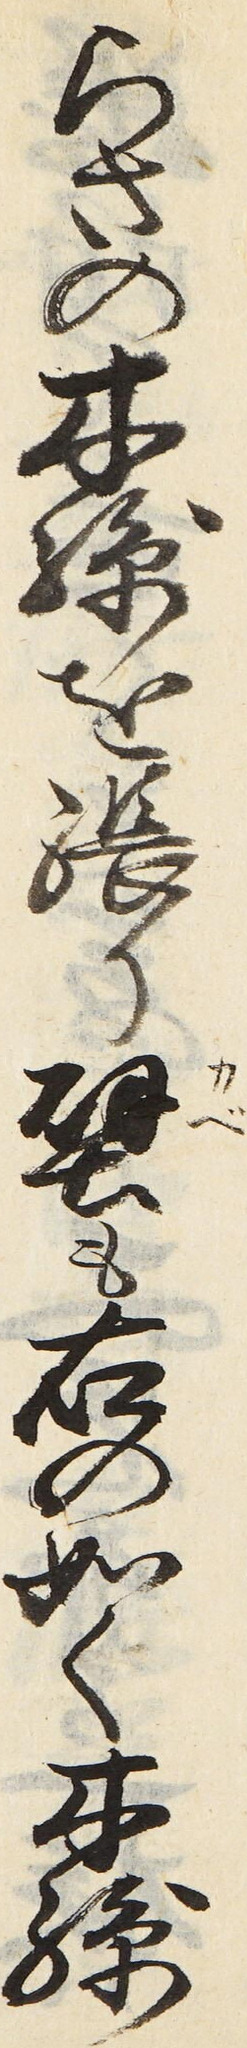らさの木綿を張り壁も右の如く木綿
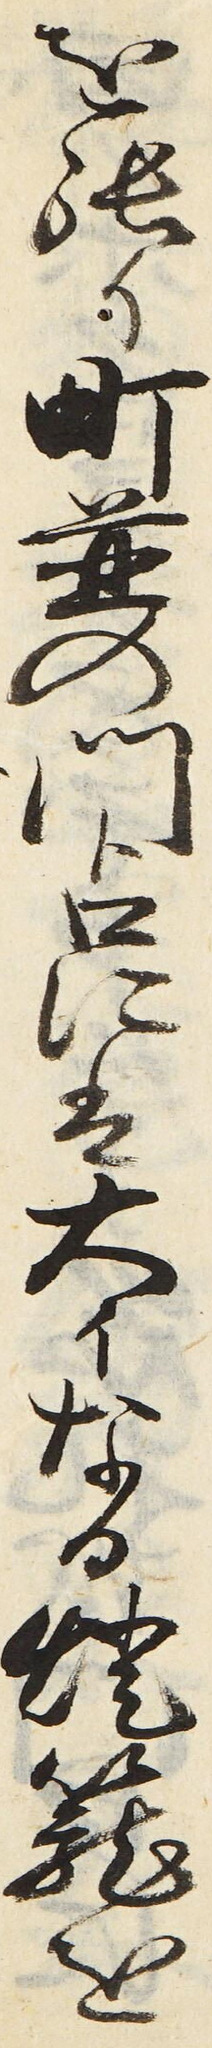を張り町並の門と口には大イなる燈籠を
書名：華夷九年録
